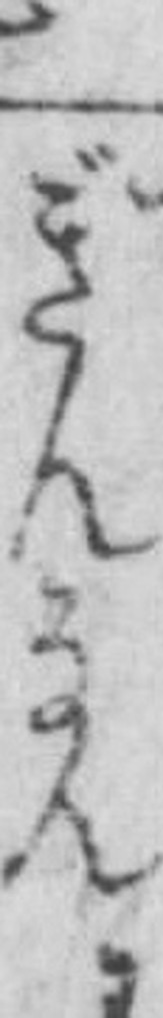ぎんなん
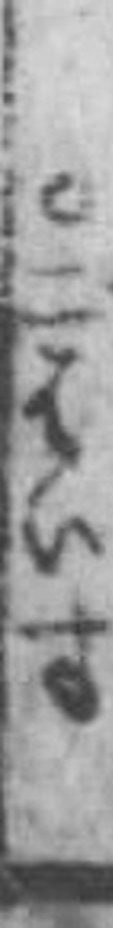〇二はいす
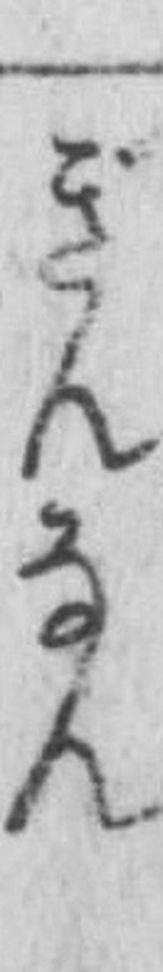ぎんなん
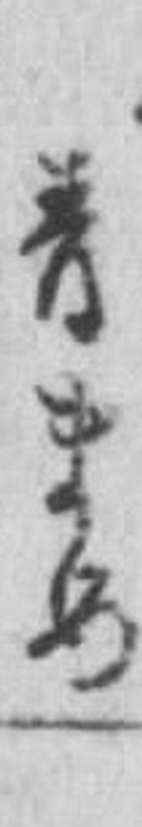青まめ
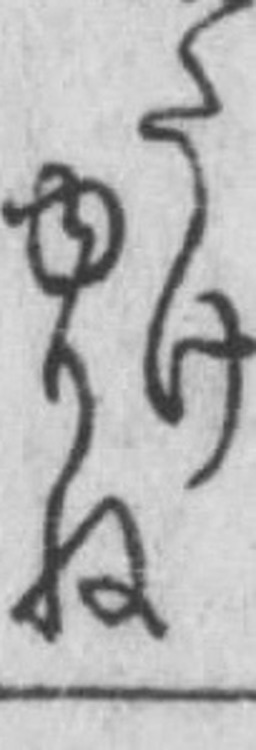ゆりね
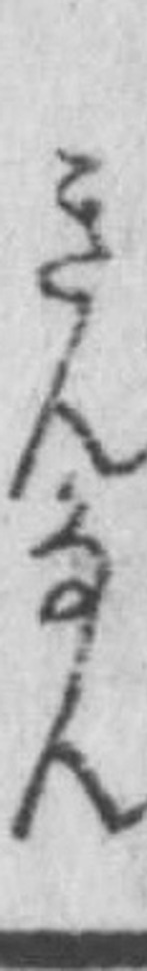ぎんなん
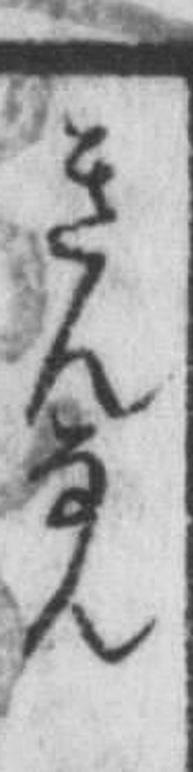ぎんなん
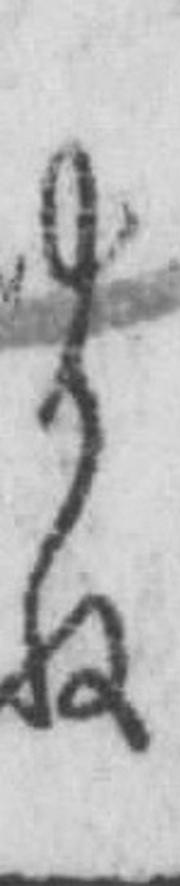ゆりね
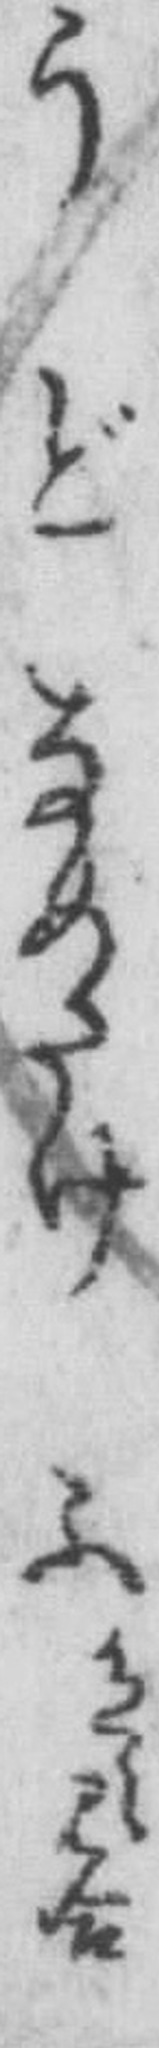うどなめたけふ色々見合
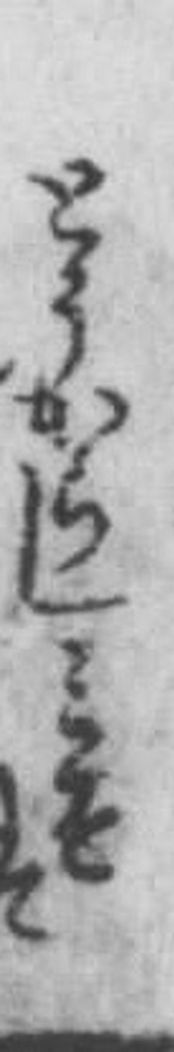とうからしミそ
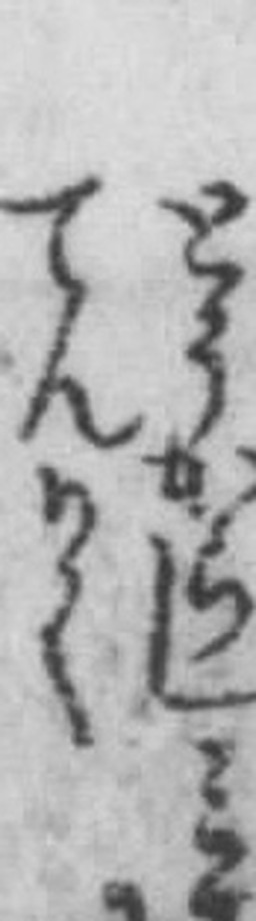てんかく
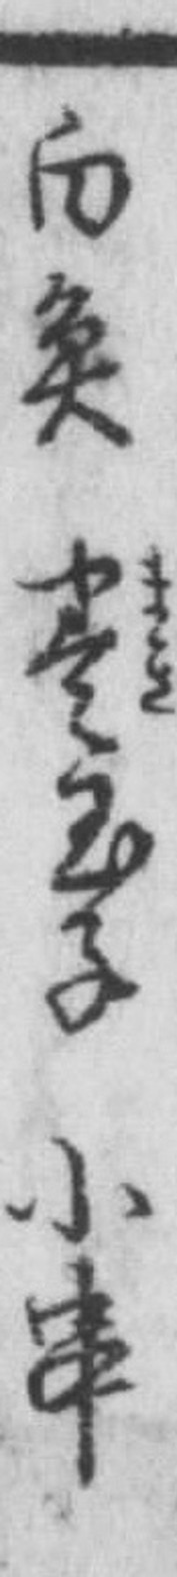白魚巻玉子小串
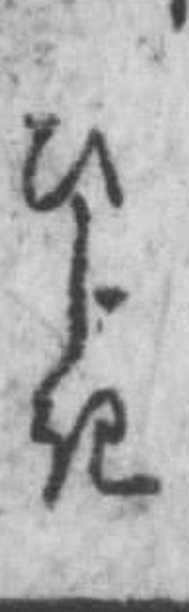ひじき
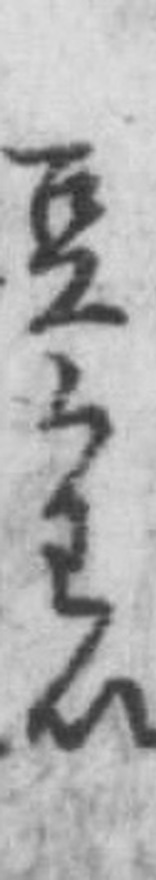豆くわい
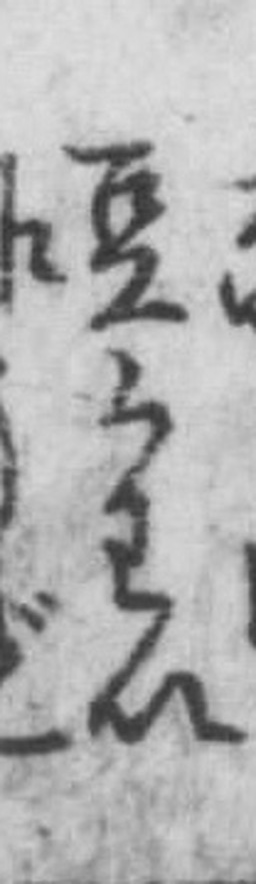豆くわい
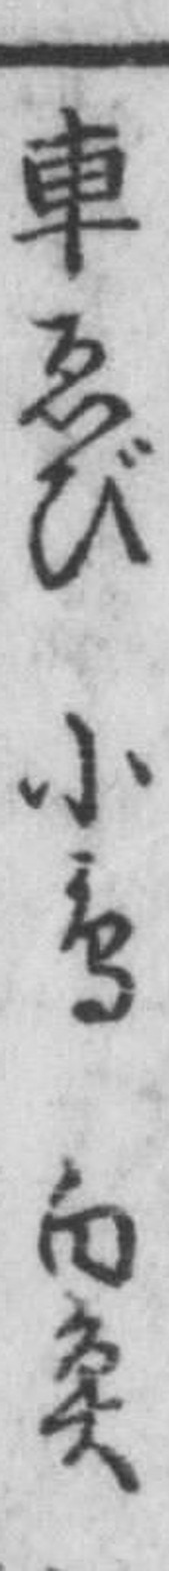車ゑび小鳥白魚
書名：当世料理筌
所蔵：大阪府立大学学術情報センター 国文学研究資料館
